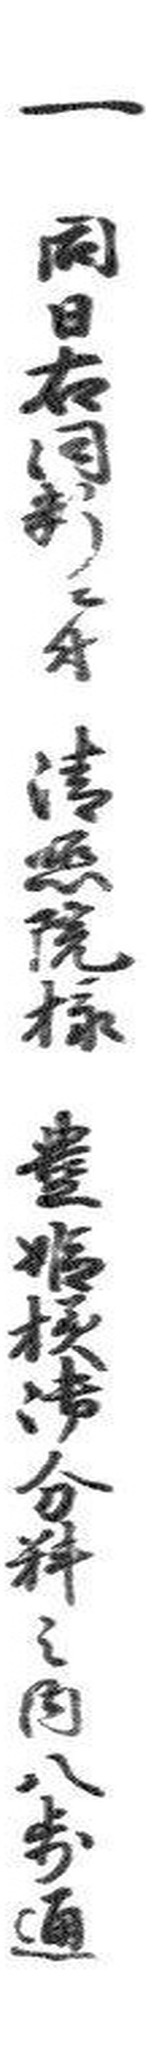一同日右同断ニ付清照院様豊姫様御分料之内八歩通
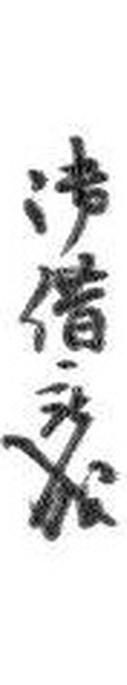御借被成

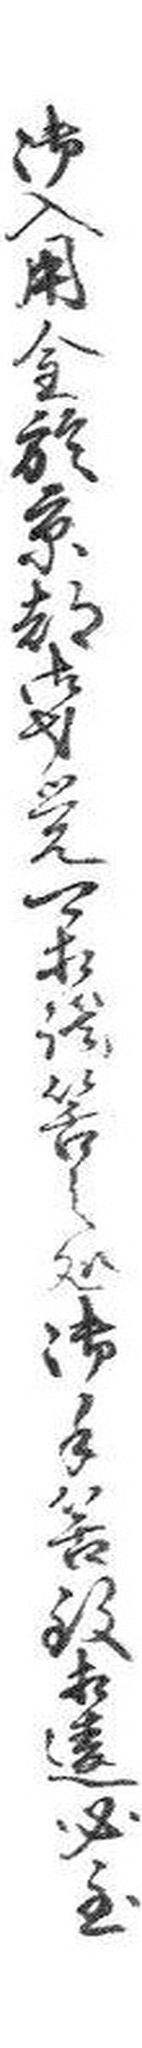御入用金於京都御才覚可相調筈之処御手筈致相違必至
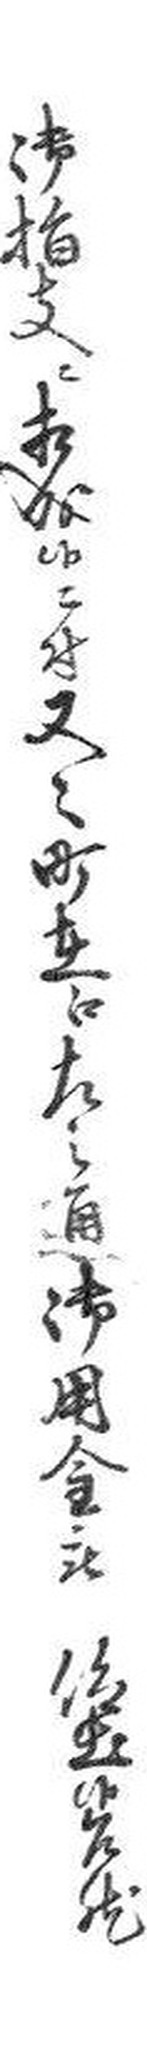御指支ニ相成候ニ付又々町在江左之通御用金被仰出候乍然
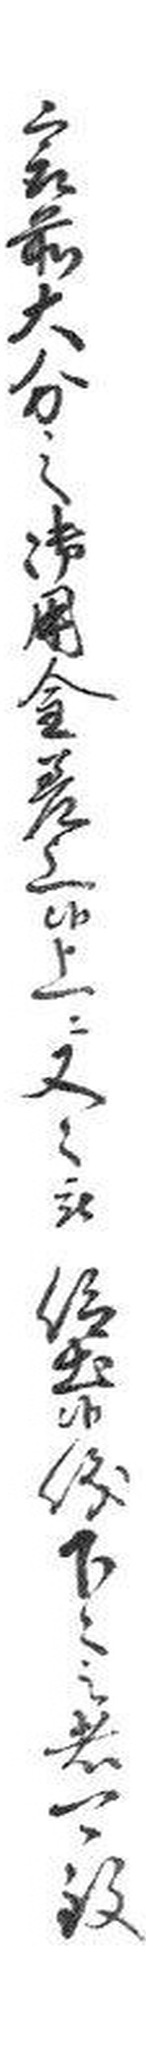最前大分之御用金差上候上ニ又々被仰出候儀下々之者可致
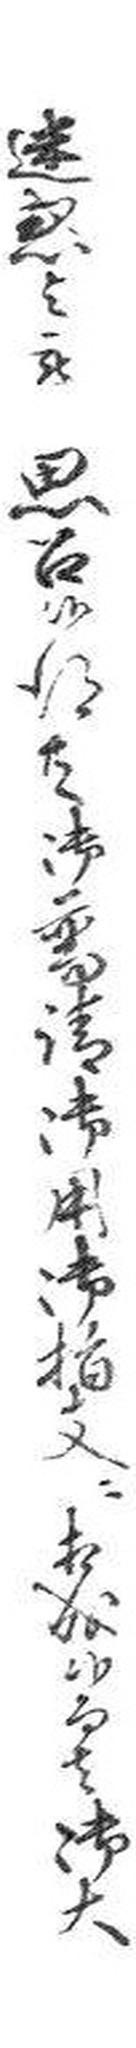迷惑与被思召候得共御普請御用御指支ニ相成候而者御大
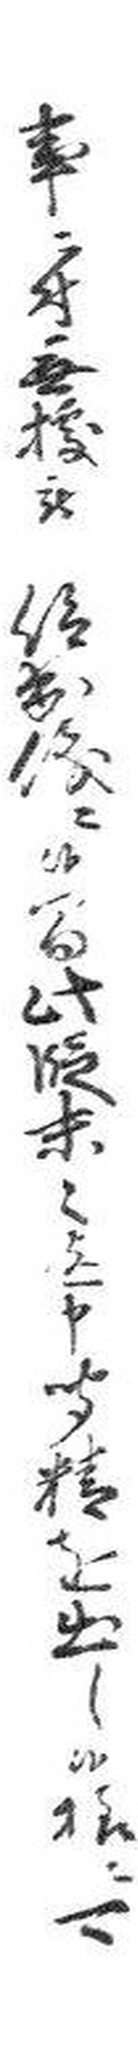事ニ付無拠被仰出儀ニ候間此段末々迄申聞精を出し候様ニ可
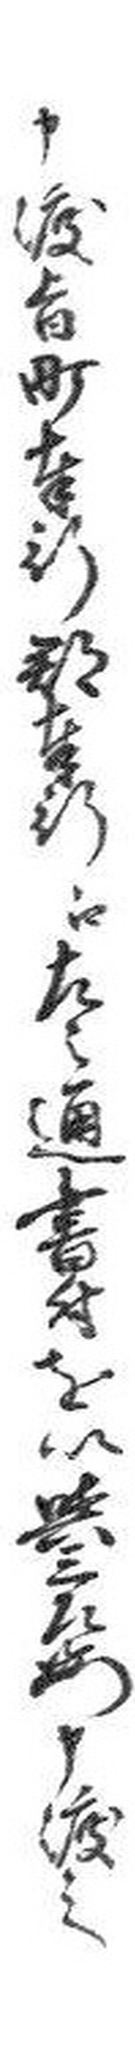申渡旨町奉行郡奉行江左之通書付を以与三左衛門申渡之
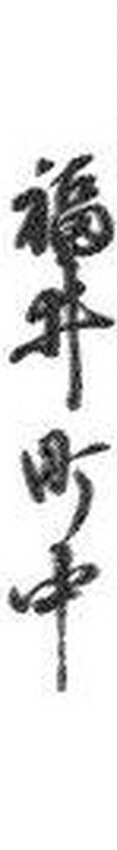福井町中
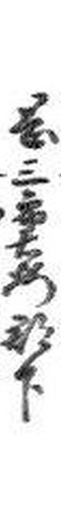岡三郎右衛門郡下
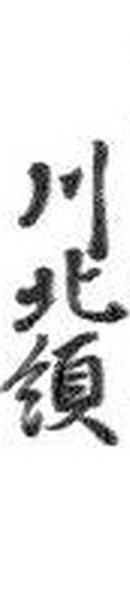川北領
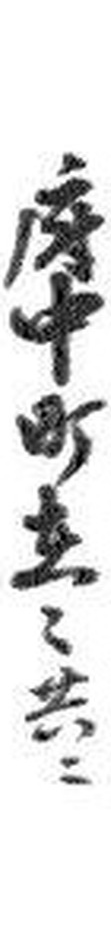府中町在々共ニ
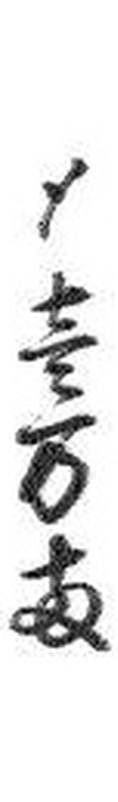〆壱万両
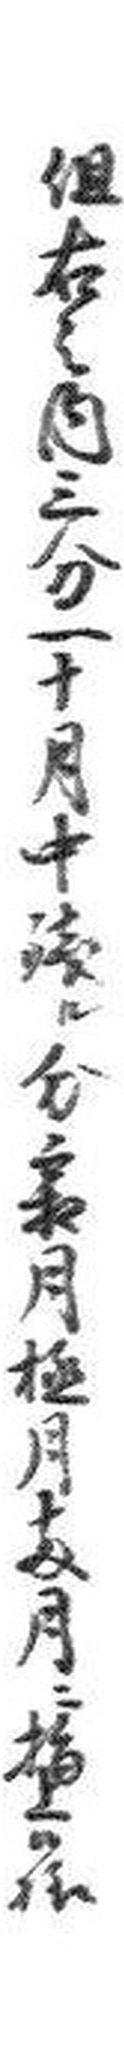但右之内三分一十月中残ル分霜月極月両月ニ指上候様
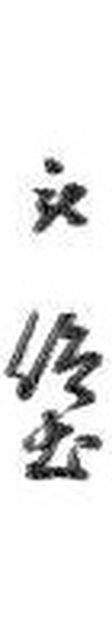被仰出

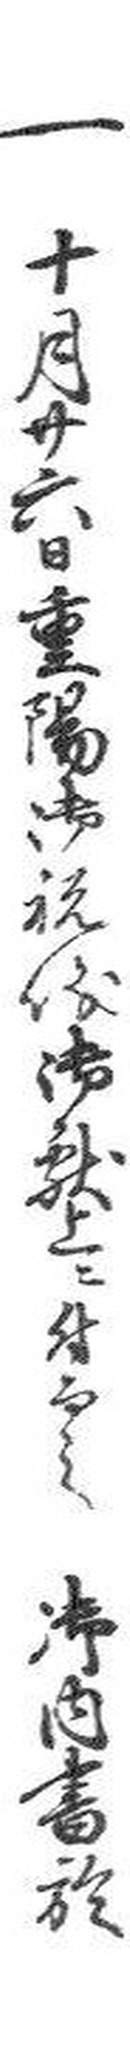一十月廿六日重陽御祝儀御献上ニ付而之御内書於
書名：家譜 二十三 吉品公 従宝永元年到同二年
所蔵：福井県文書館 Fukui Prefectural Archives
